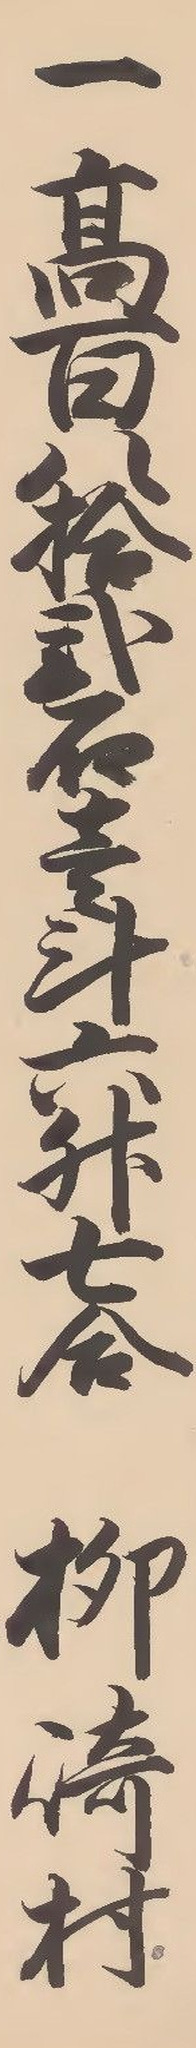一高百八拾弐石壱斗六升七合柳崎村
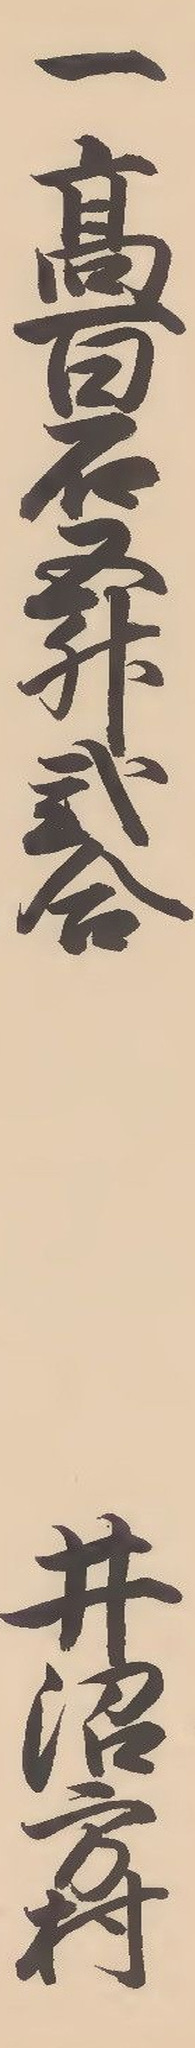一高百石五升弐合井沼方村
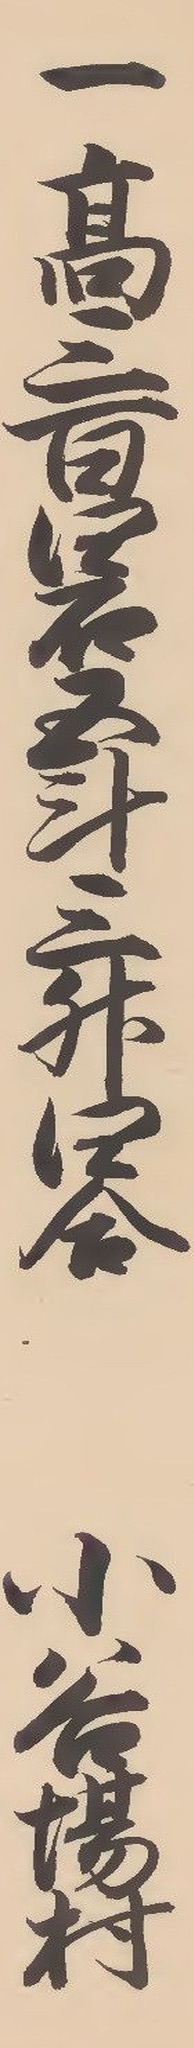一高三百四石五斗三升四合小谷場村
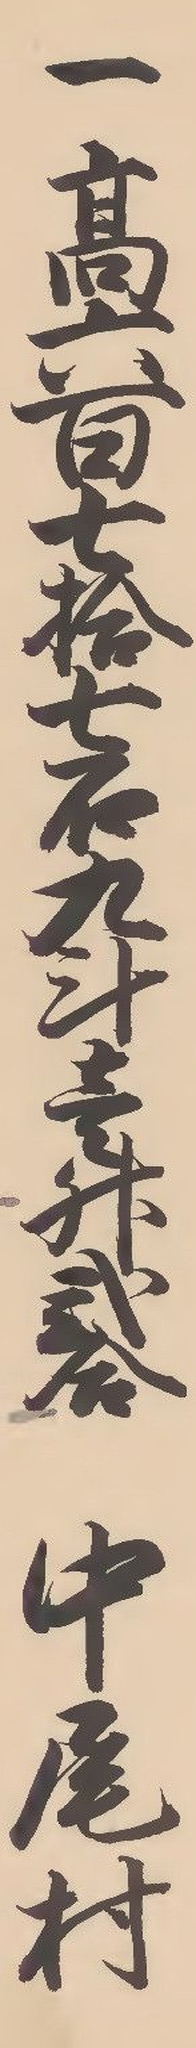一高六百七拾七石九斗壱升弐合中尾村

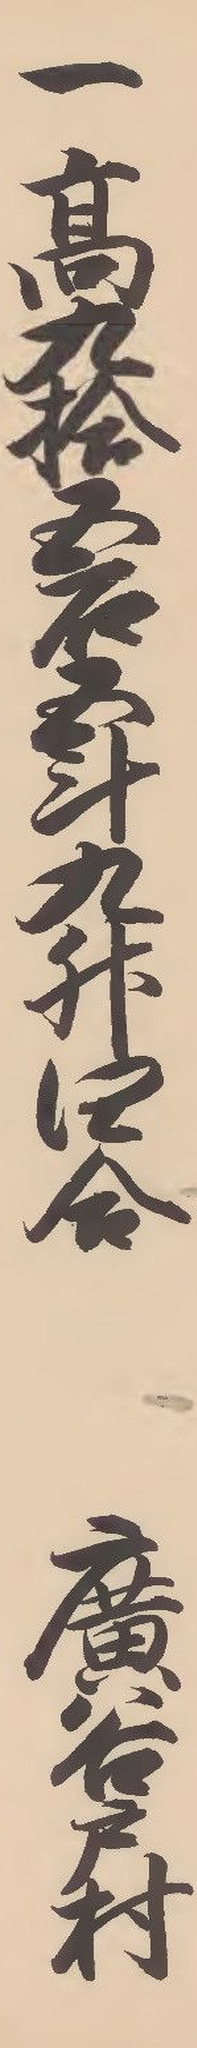一高九拾五石五斗九升四合広谷戸村
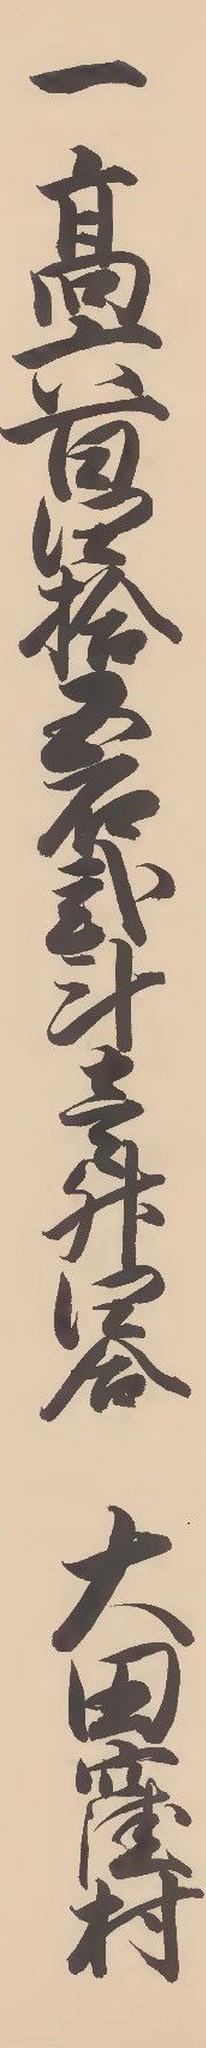一高六百四拾五石弐斗壱升四合大田窪村
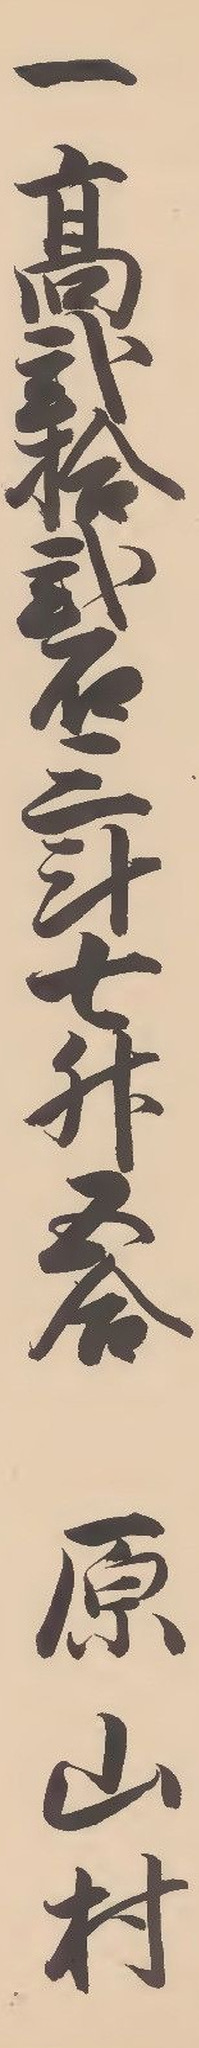一高弐拾弐石三斗七升五合原山村
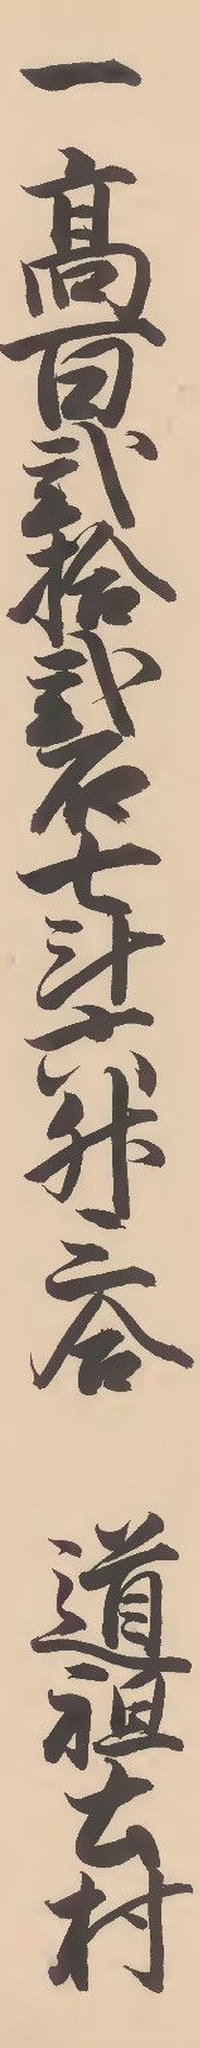一高百弐拾弐石七斗六升三合道祖土村
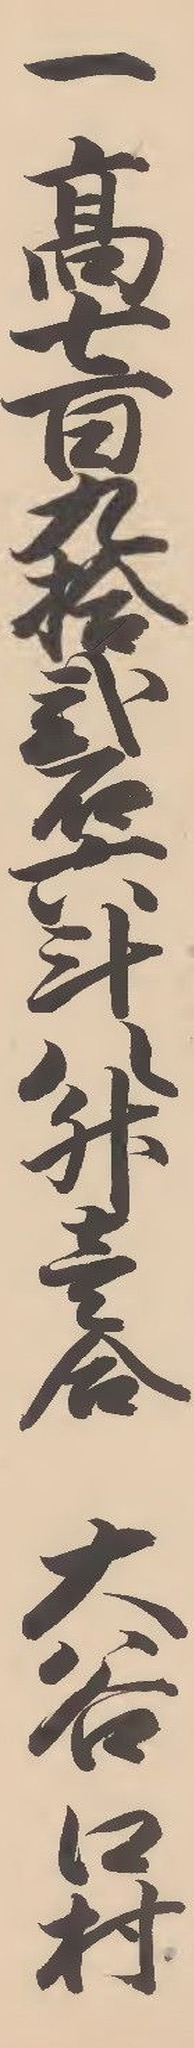一高七百九拾弐石六斗八升壱合大谷口村
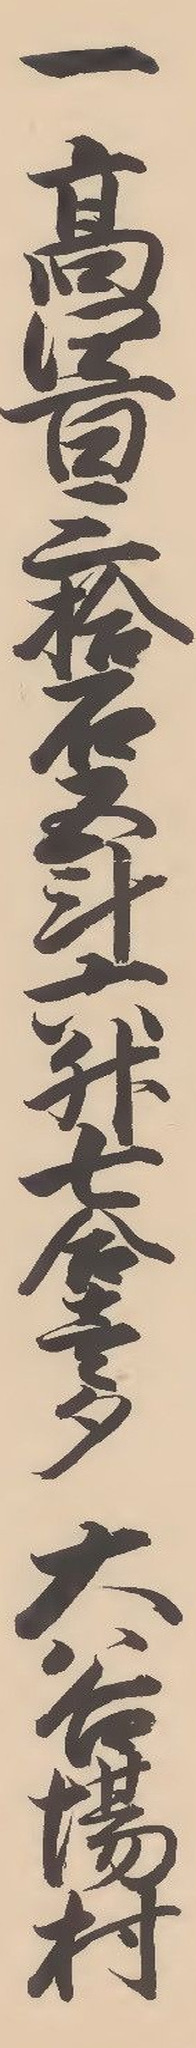一高四百三拾石五斗六升七合壱勺大谷場村
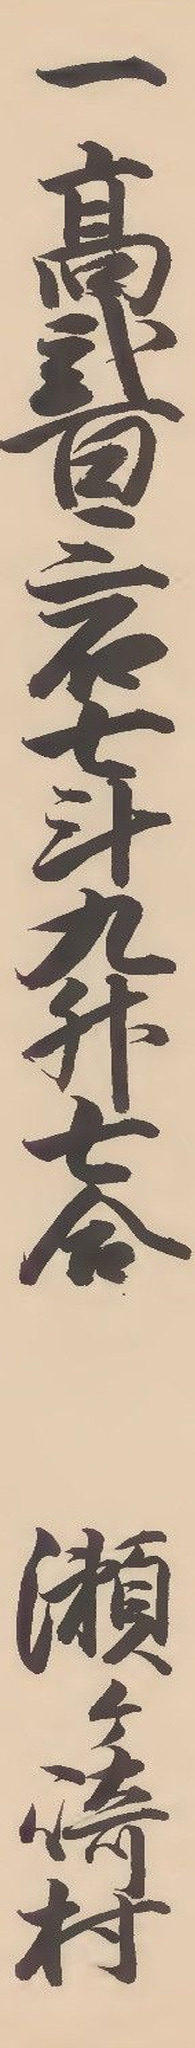一高弐百三石七斗九升七合瀬ヶ崎村
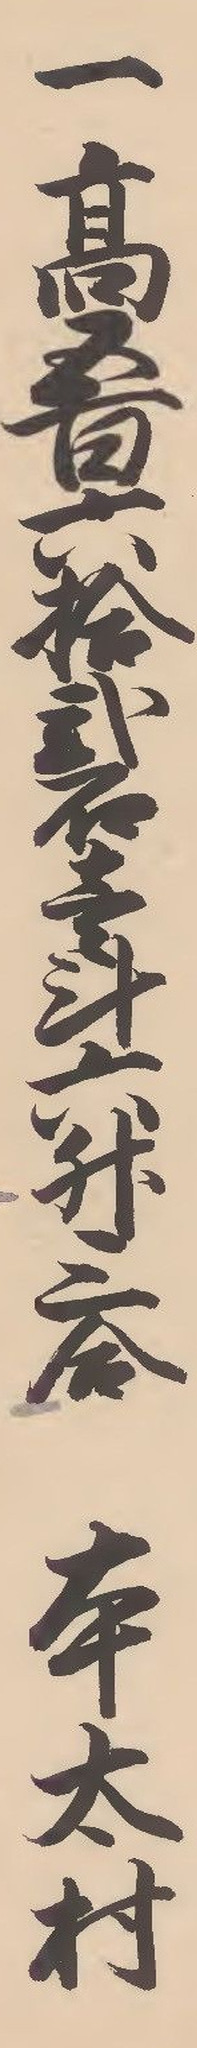一高五百六拾弐石壱斗六升三合本太村

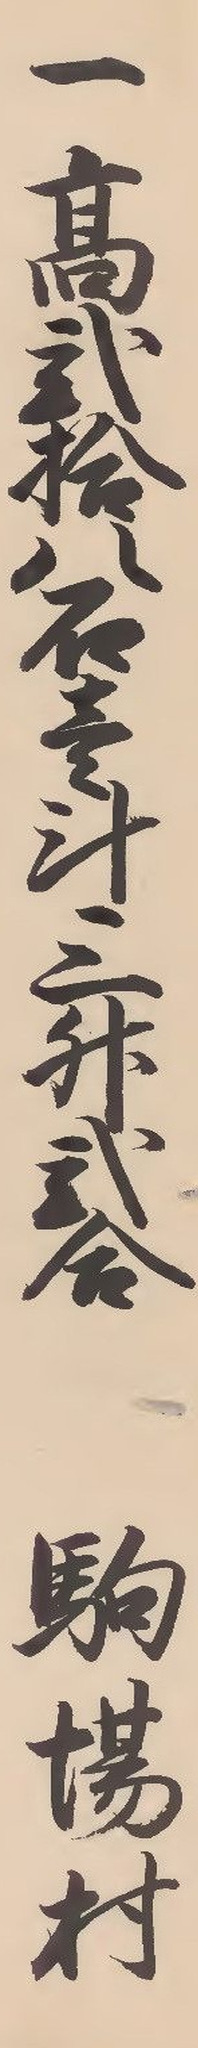一高弐拾八石壱斗三升弐合駒場村
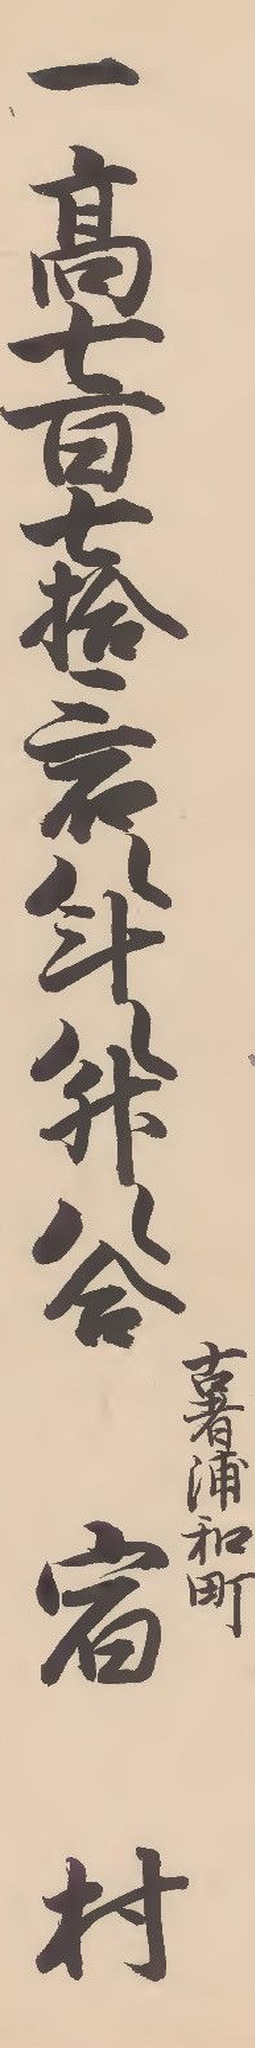一高七百七拾三石八斗八升八合宿村
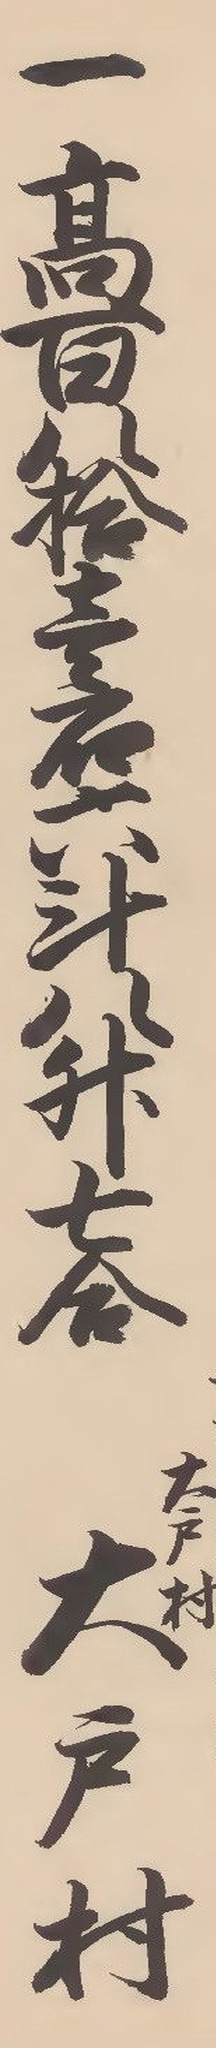一高百八拾壱石六斗八升七合大戸村
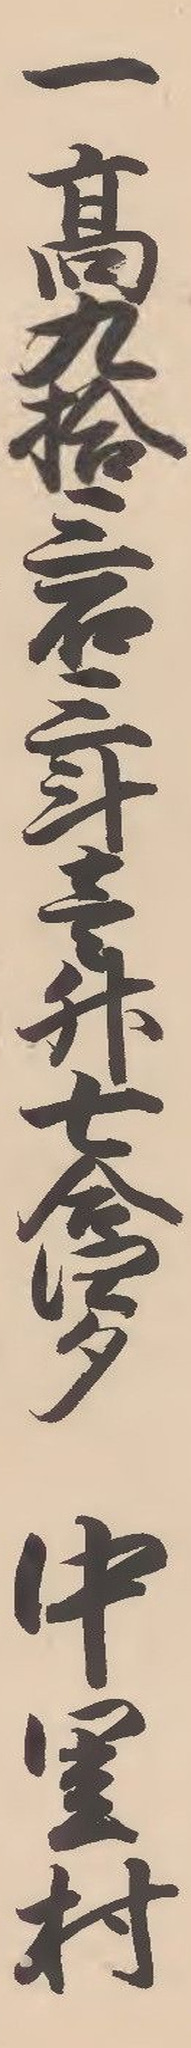一高九拾三石三斗壱升七合四勺中里村
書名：武蔵国郷帳　下
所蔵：国立公文書館 National Archives of Japan
